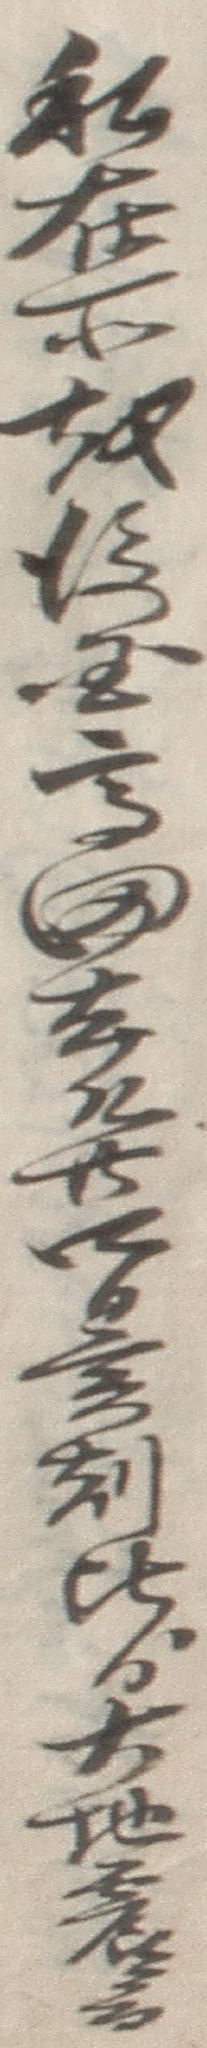私在所越後国高田去廿四日夜亥刻比ゟ大地震二而
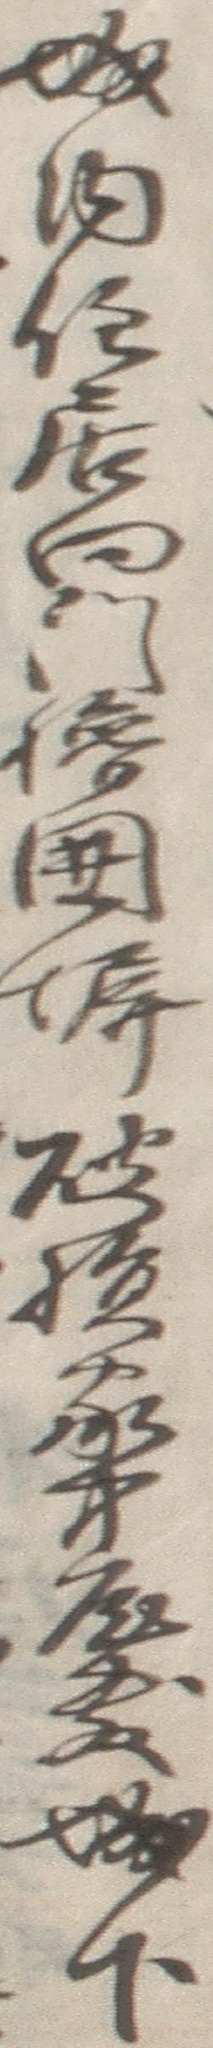城内住居向門櫓囲塀破損家中屋敷城下
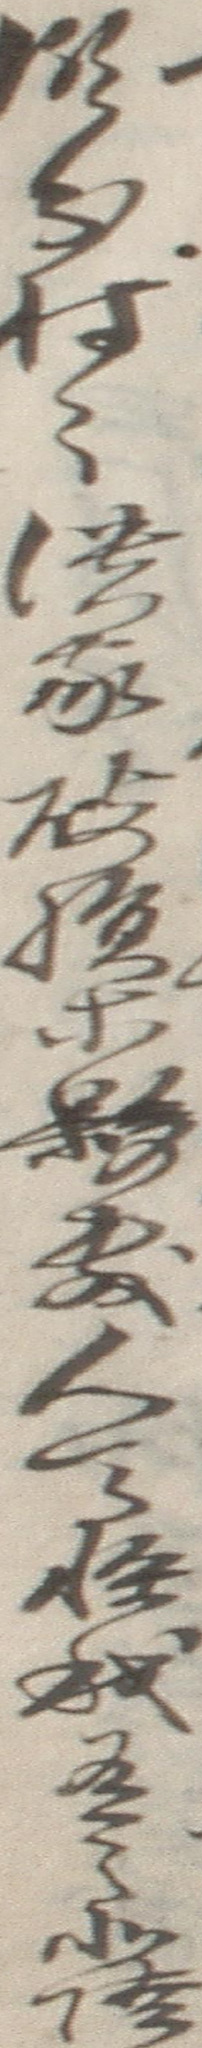領分村々潰家破損等夥敷人馬怪我有之北陸
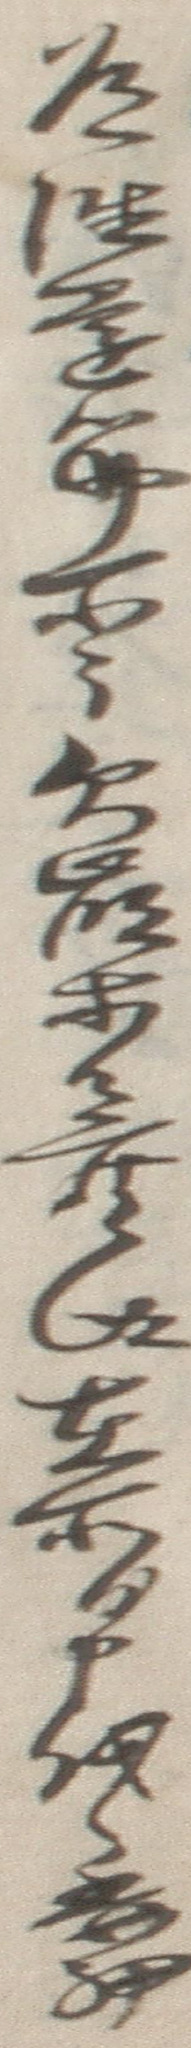往還筋所々欠崩等御座候趣在所ゟ申越候委細

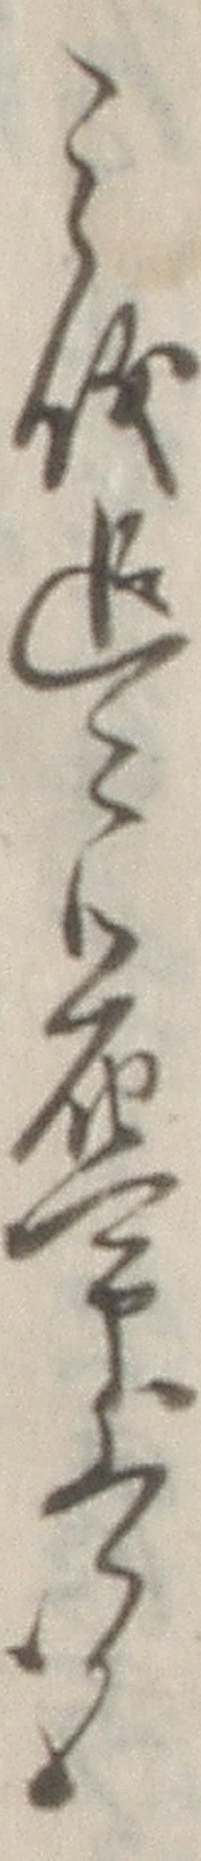之儀追々御届可申上候以上
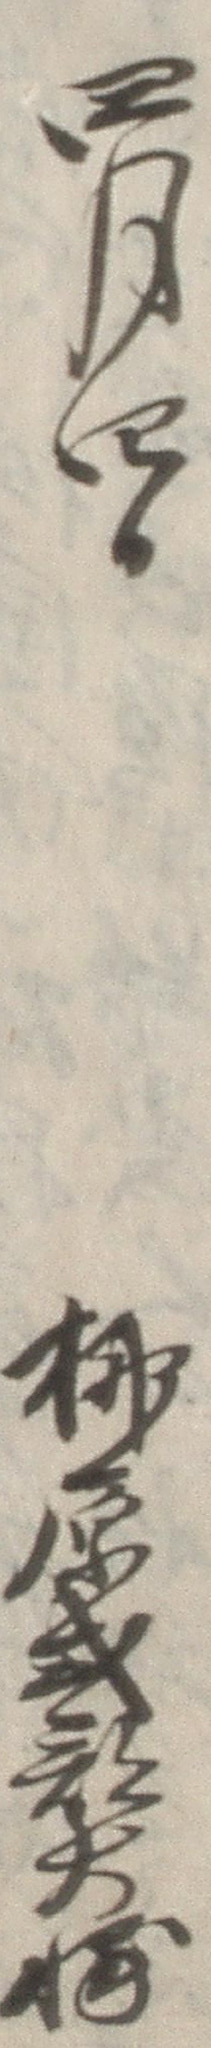四月四日榊原式部大輔
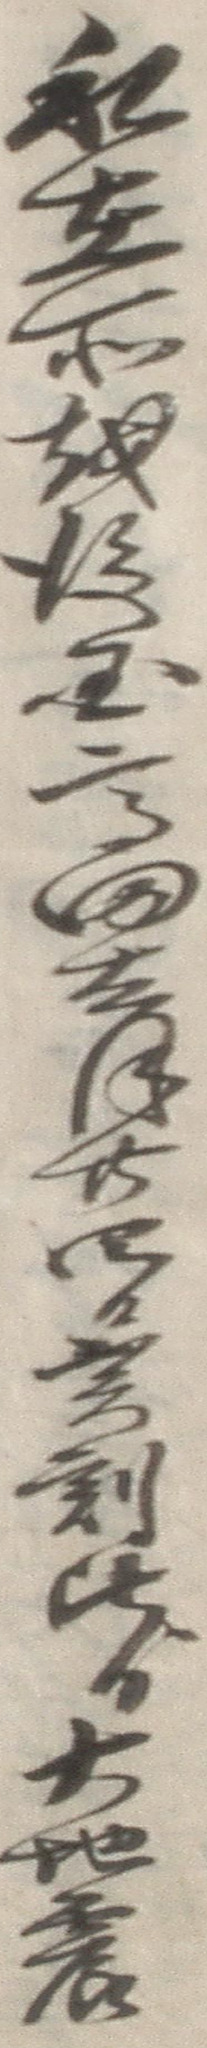私在所越後国高田去月廿四日亥刻比ゟ大地震
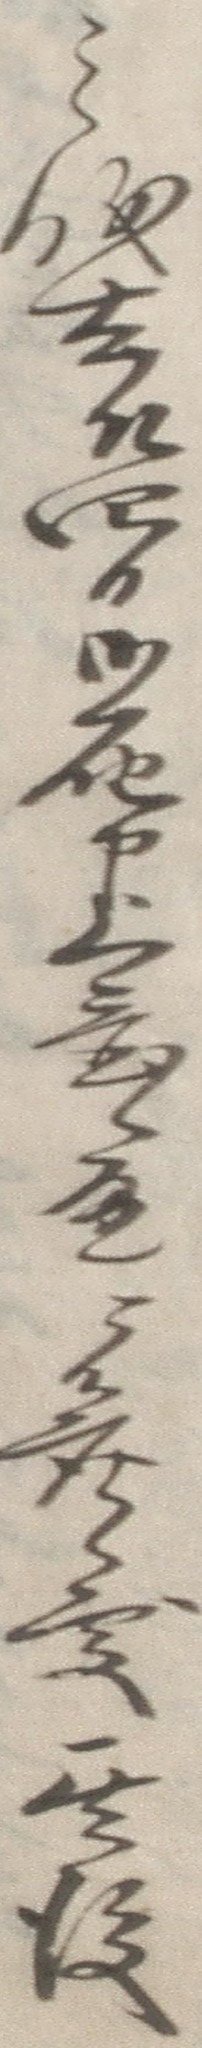之儀去ㇽ四日御届申上置候通二御座候処其後
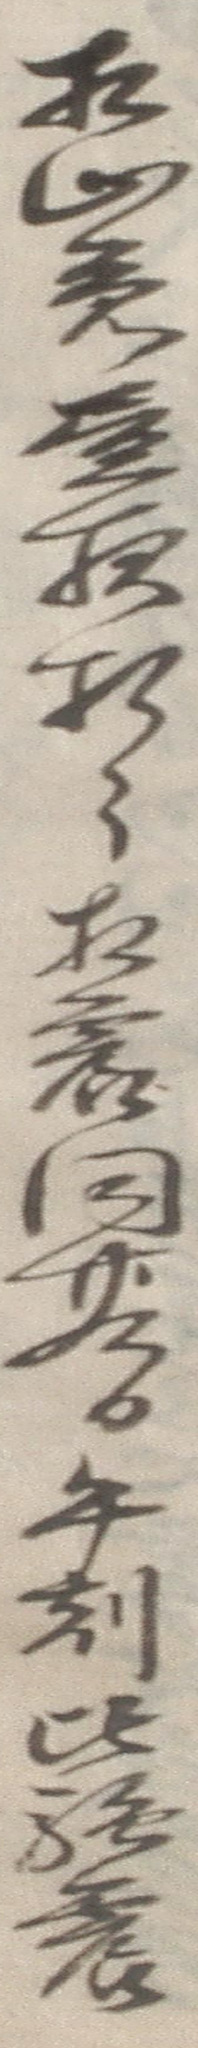相止兼昼夜折々相震同廿九日午刻比強震
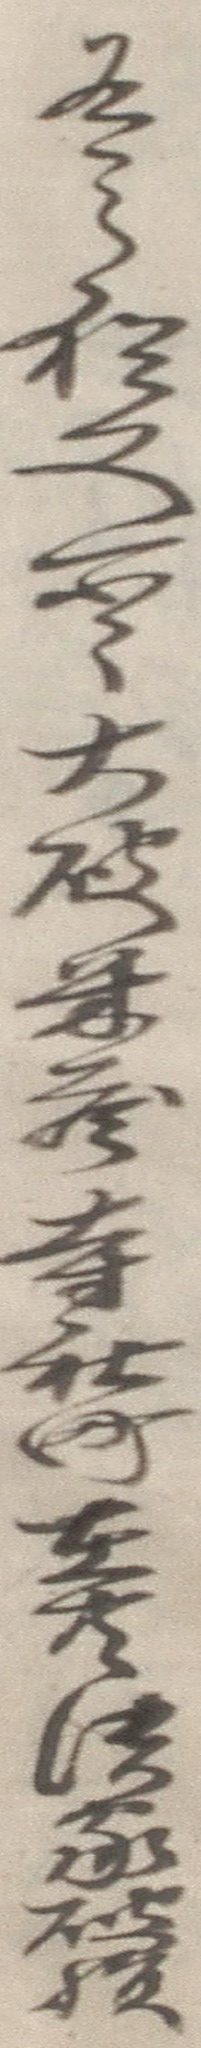有之猶又所々大破米蔵寺社町在共潰家破損
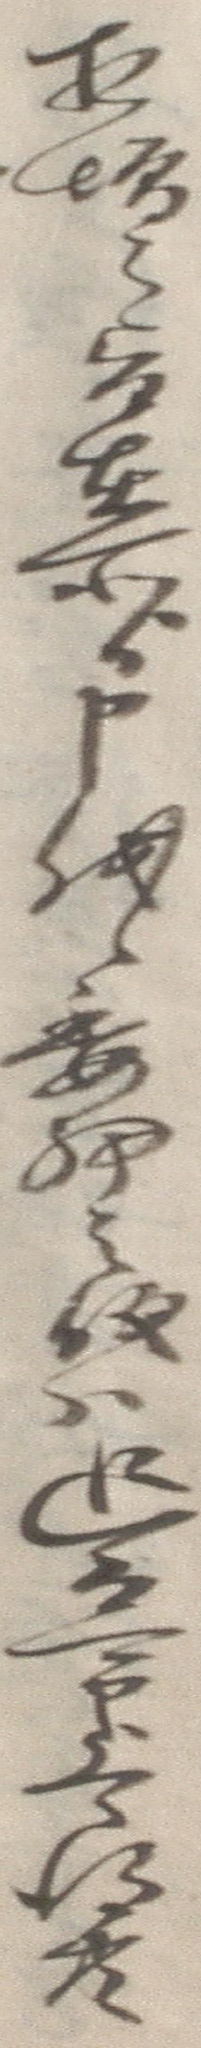相増候旨在所ゟ申越候委細之儀ハ追而可申上候得共
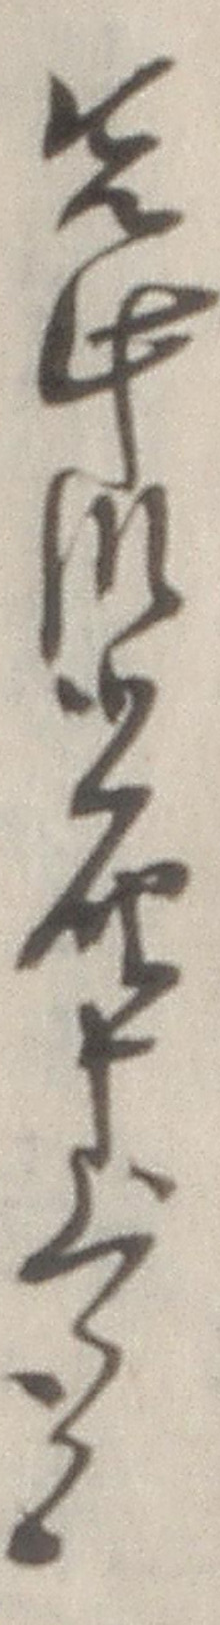先此段御届申上候以上
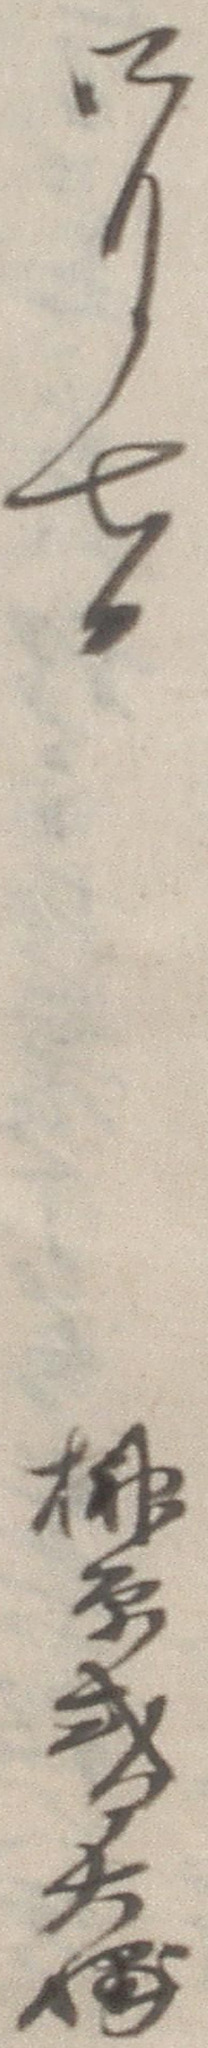四月七日榊原式部大輔
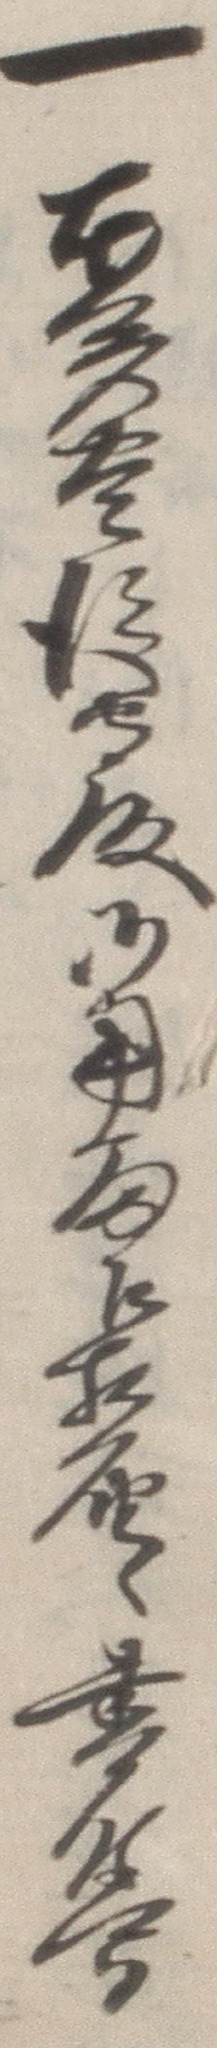一本多豊後守殿御用番江相届候書付写
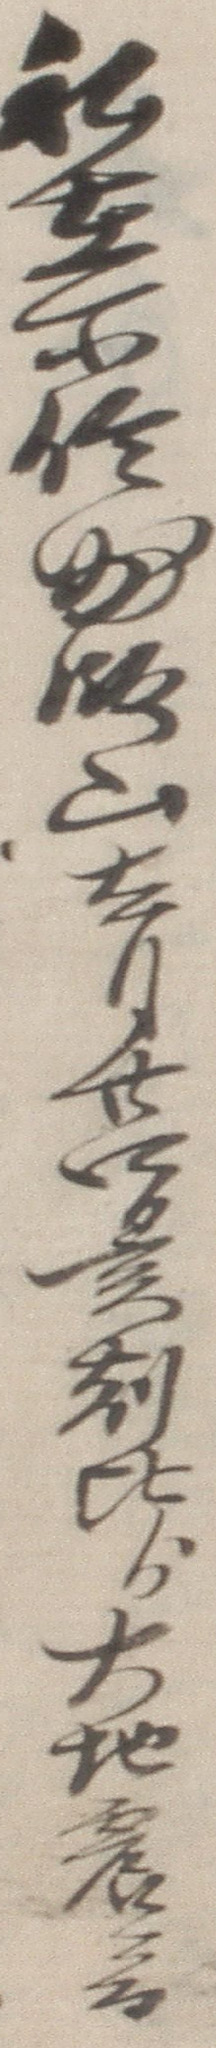私在所信州飯山去月廿四日亥刻比ゟ大地震二而
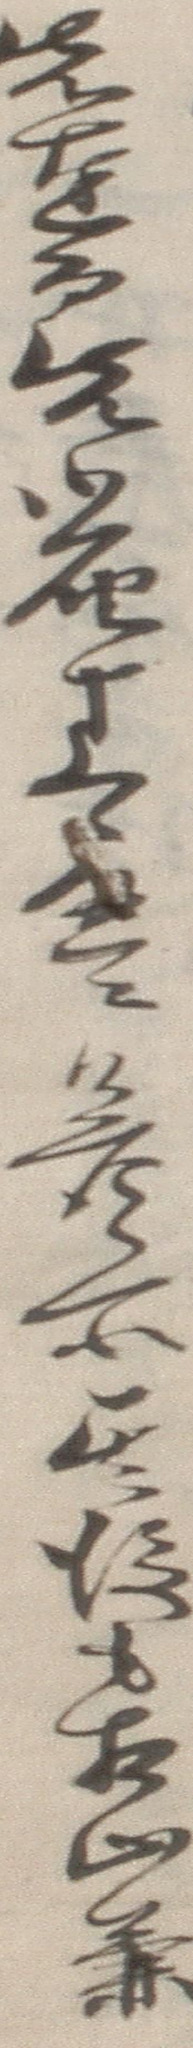先達而先御届申上候通二御座候所其後も相止兼
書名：信州地震一件
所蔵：東京大学地震研究所図書室 Earthquake Research Institute Library, The University of Tokyo, JAPAN
